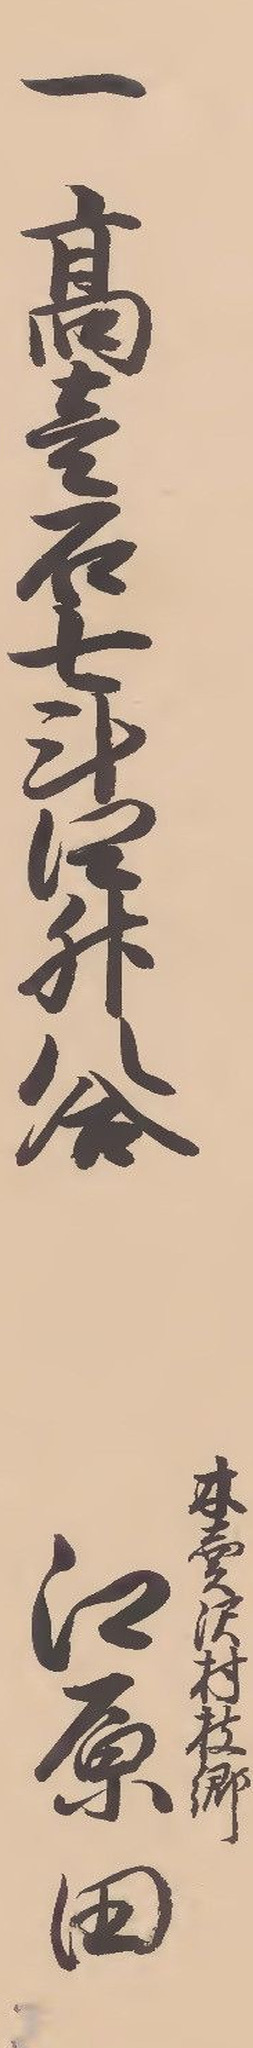一高壱石七斗四升八合江原田
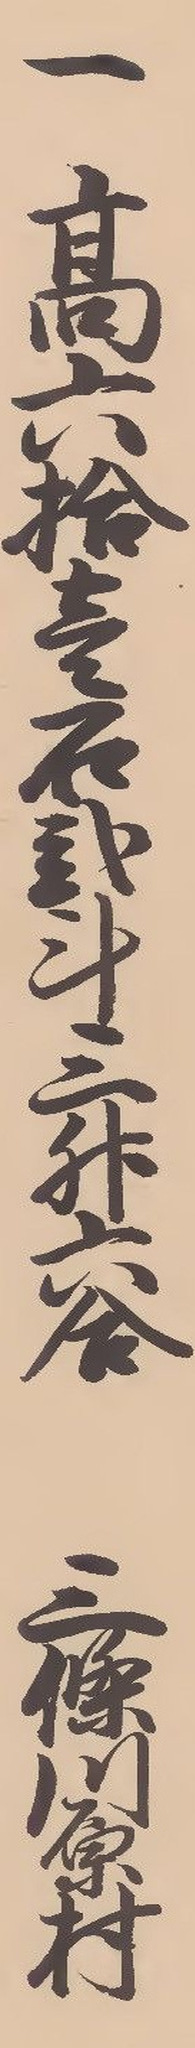一高六拾壱石弐斗三升六合三条川原村
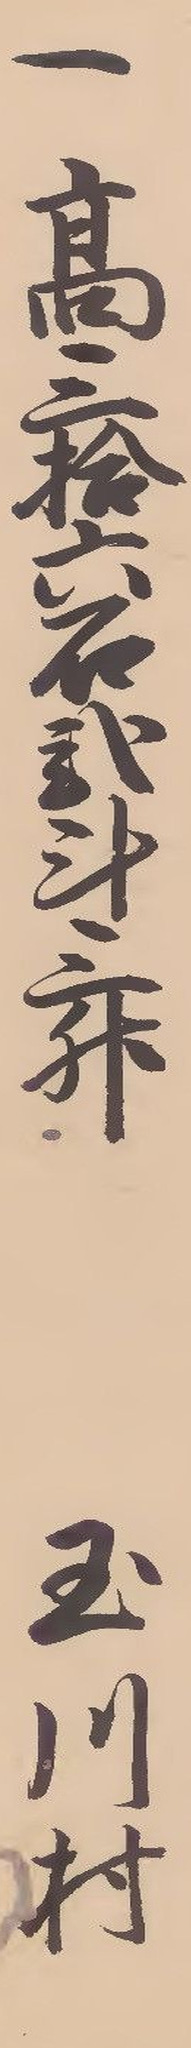一高三拾六石弐斗三升玉川村

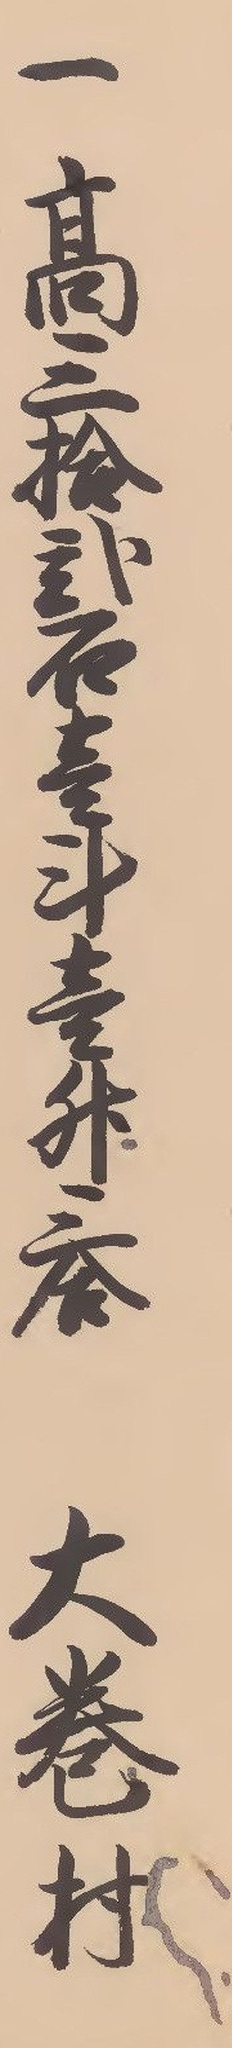一高三拾弐石壱斗壱升三合大巻村
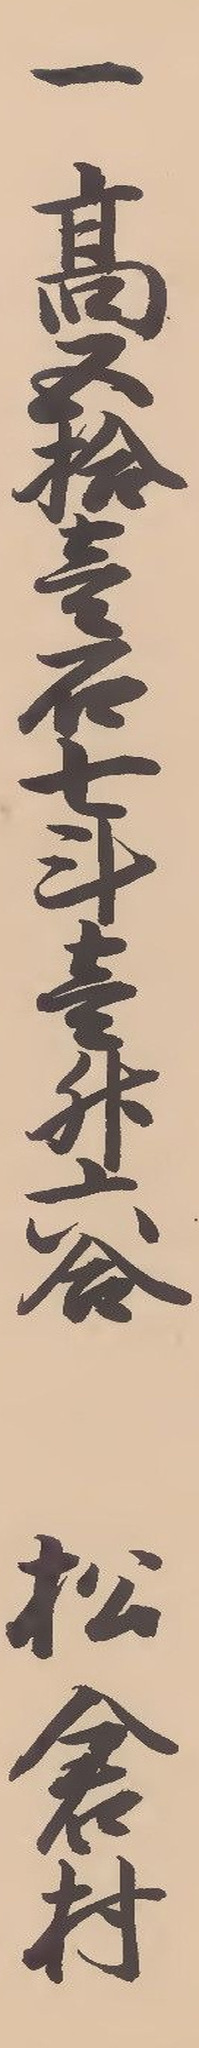一高五拾壱石七斗壱升六合松倉村
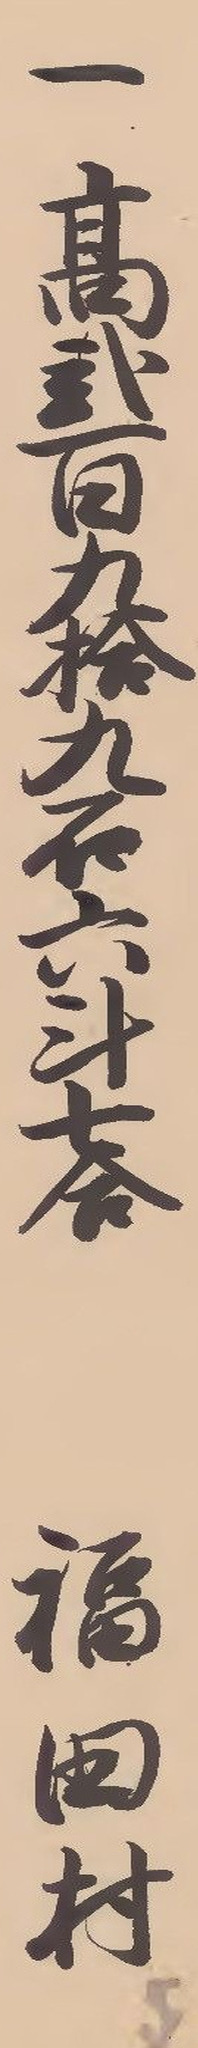一高弐百九拾九石六斗七合福田村
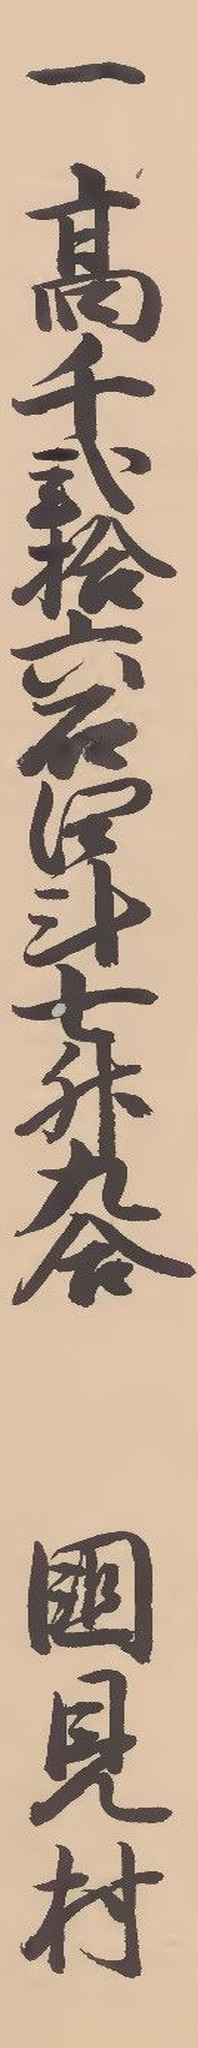一高千弐拾六石四斗七升九合国見村
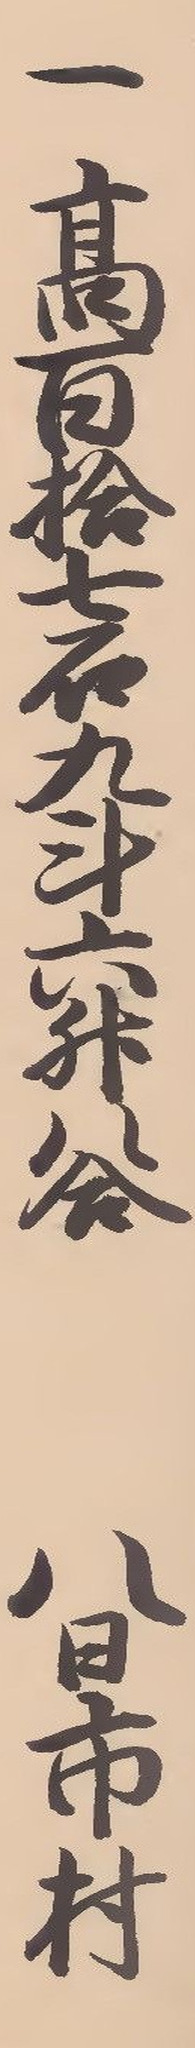一高百拾七石九斗六升八合八日市村
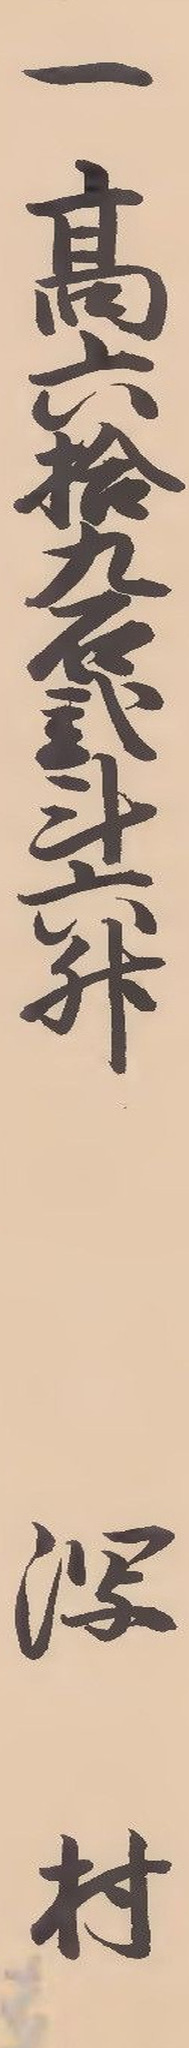一高六拾九石弐斗六升潟村
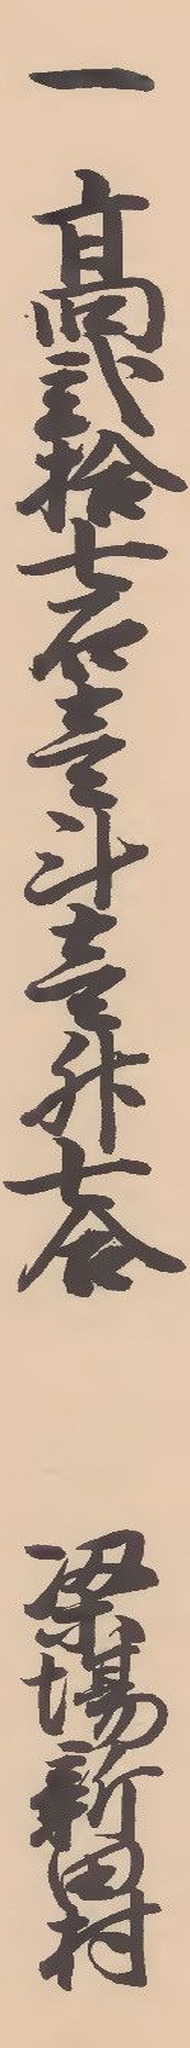一高弐拾七石壱斗壱升七合梁場新田村
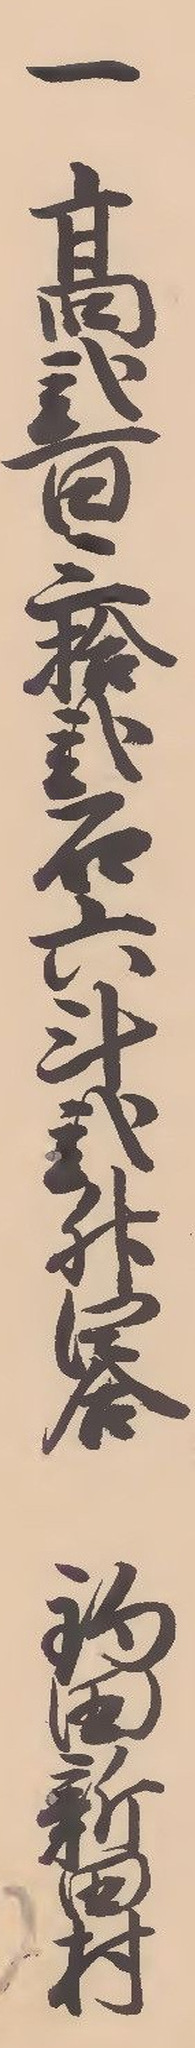一高弐百三拾弐石六斗弐升四合釣田新田村

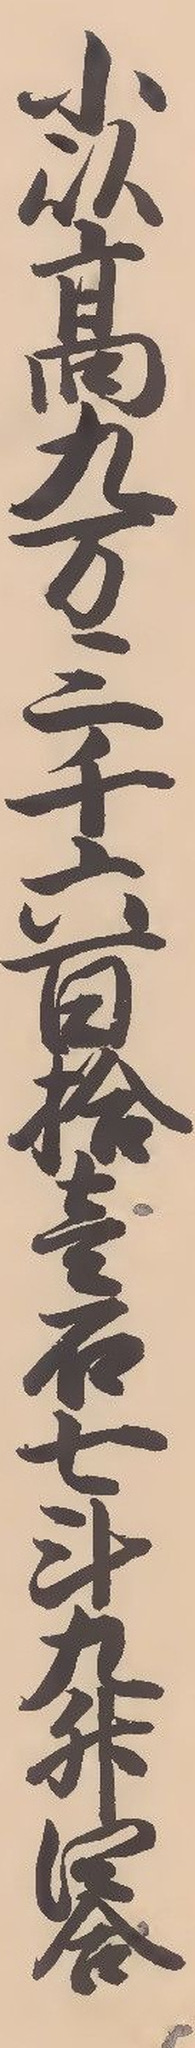小以高九万三千六百拾壱石七斗九升四合
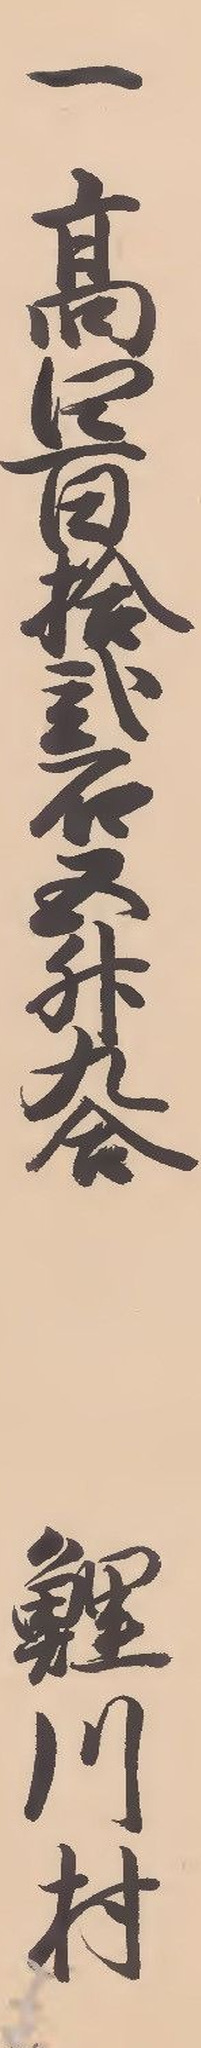一高四百拾弐石五升九合鯉川村
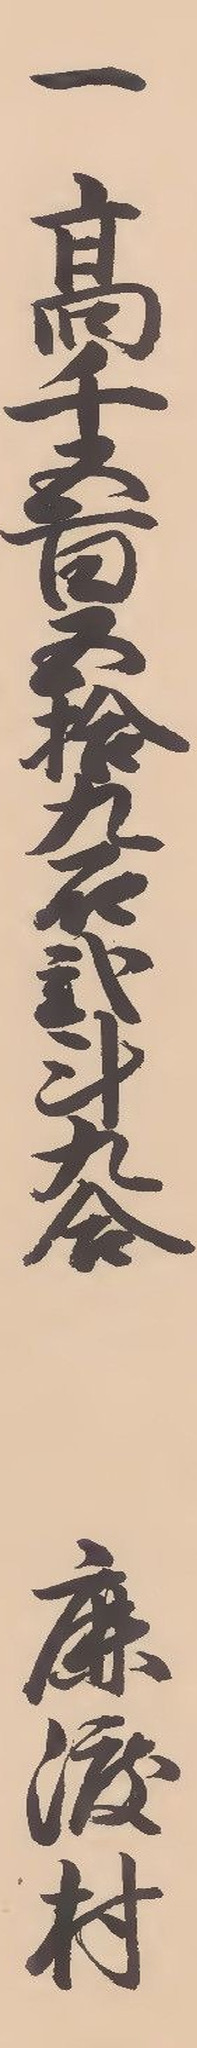一高千五百五拾九石弐斗九合鹿渡村
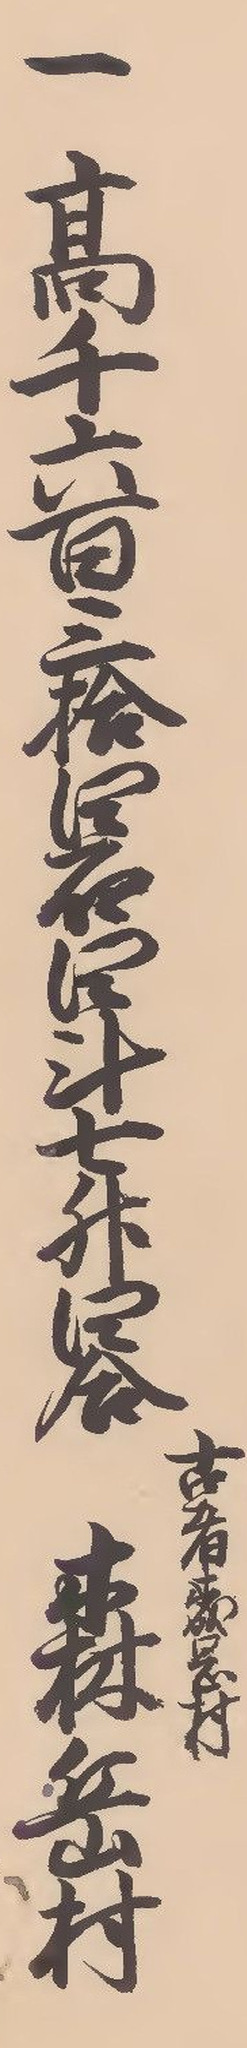一高千六百三拾四石四斗七升四合森岳村

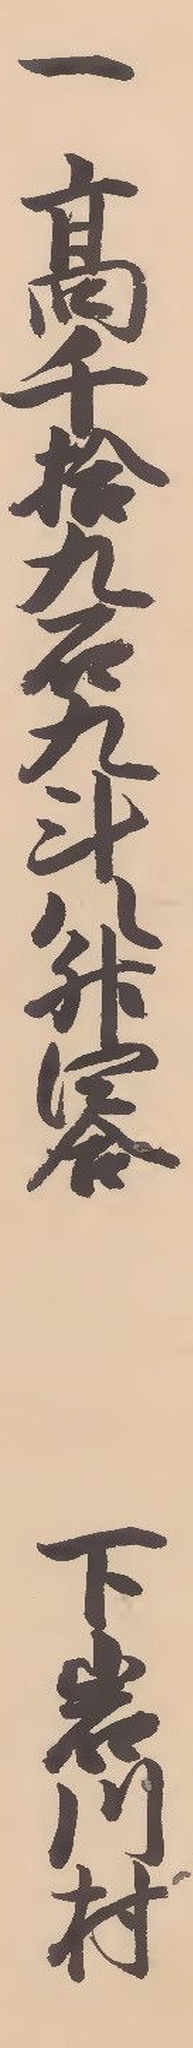一高千拾九石九斗八升四合下岩川村
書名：出羽国郷帳　５
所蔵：国立公文書館 National Archives of Japan
